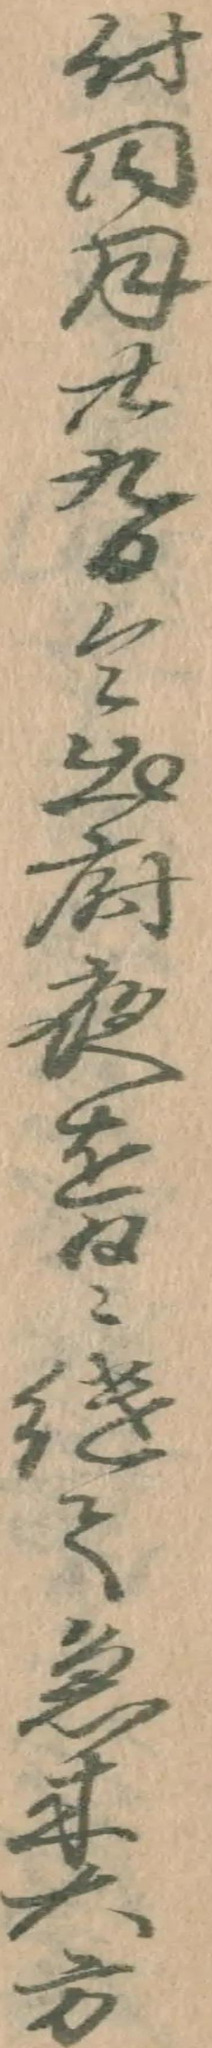付同月廿九日令出府夜を日々継て急来大方
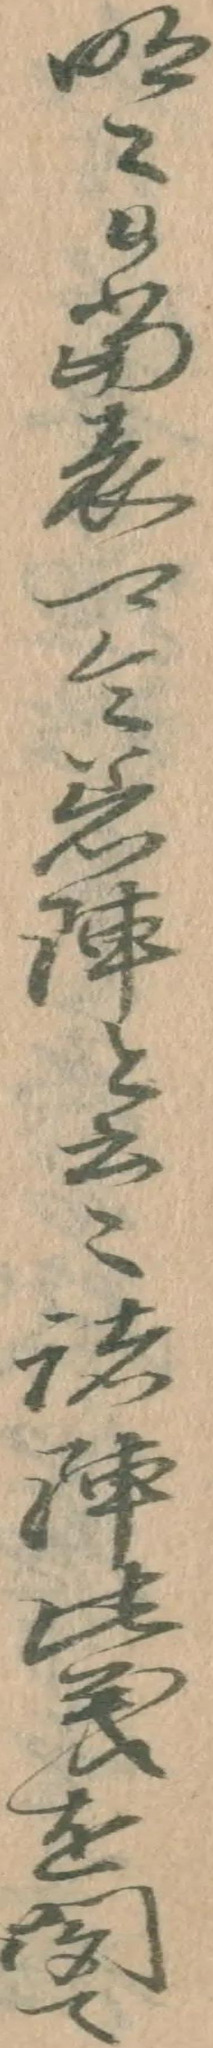明々日当表可令着陣と云々諸陣此義を聞て
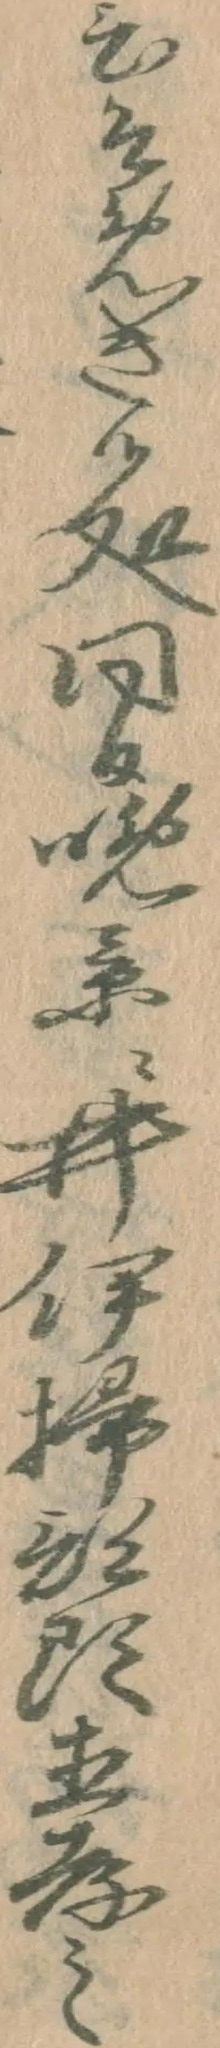云そ免き候処同日晩参に井伊掃部頭直孝之
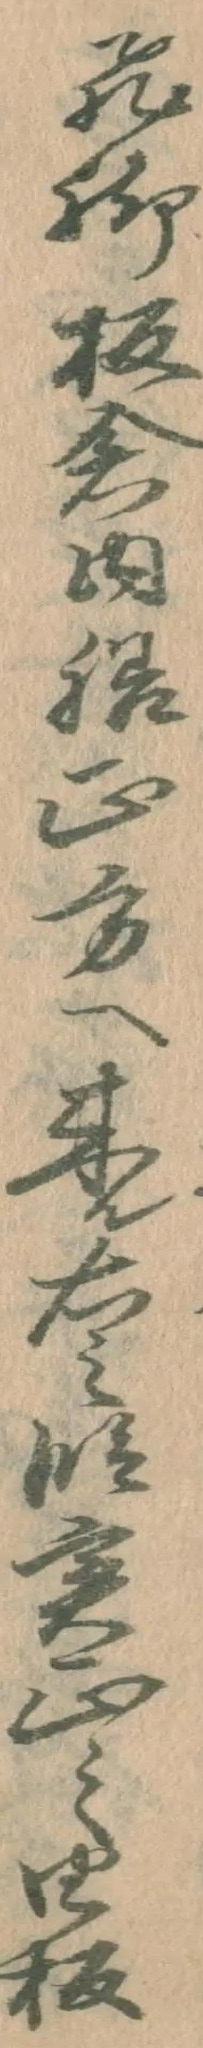飛脚板倉内膳正方へ来る右之段実正之由板
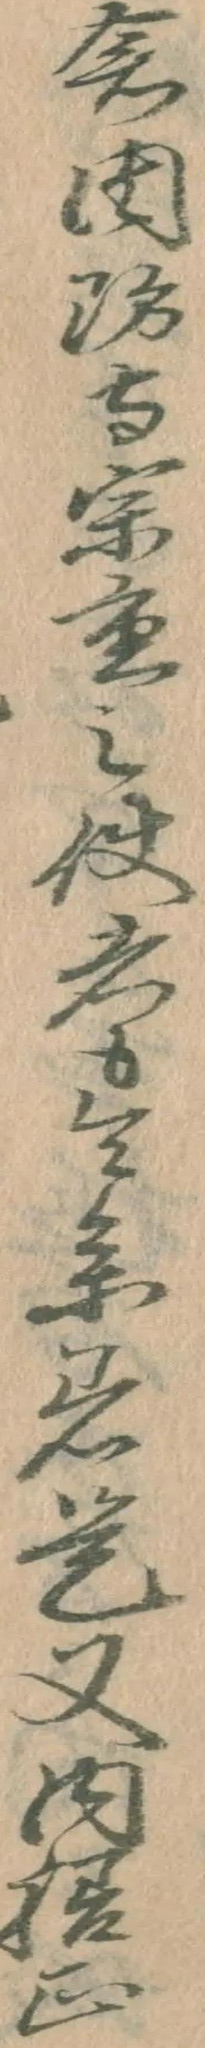倉周防守宗重之使者も令参着是又内膳正
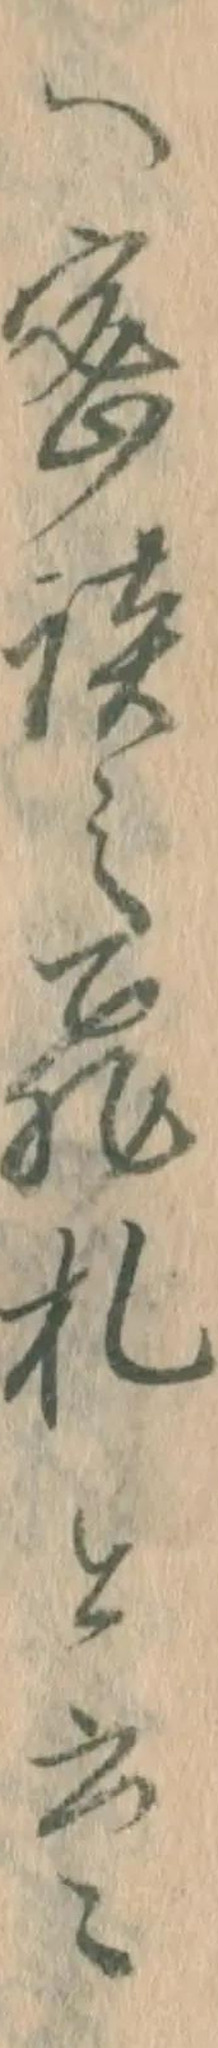へ密談之飛札と云々
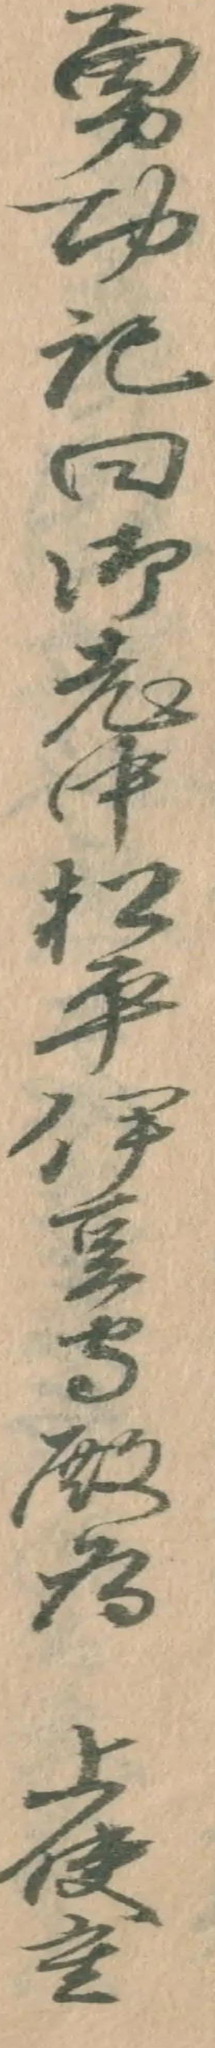勇功記曰御老中松平伊豆守殿為上使重
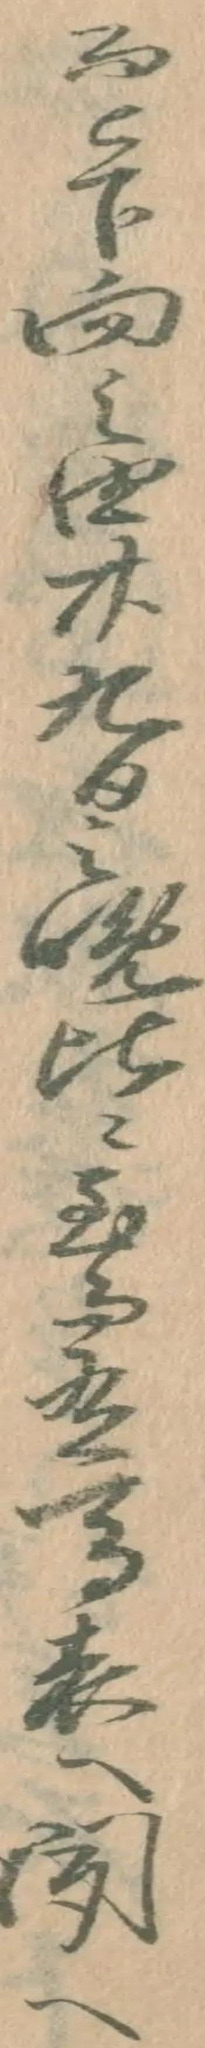而被下向之由廿九日之晩比に至而有馬表へ聞へ

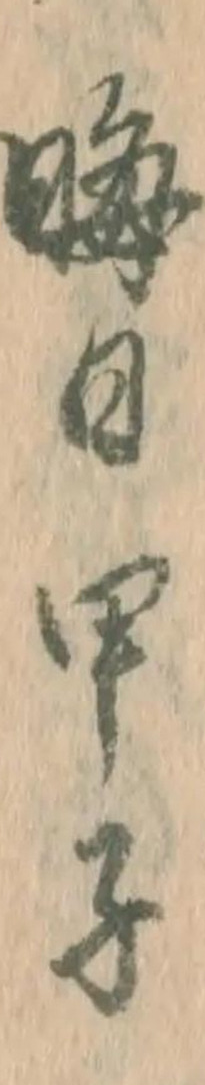晦日甲子
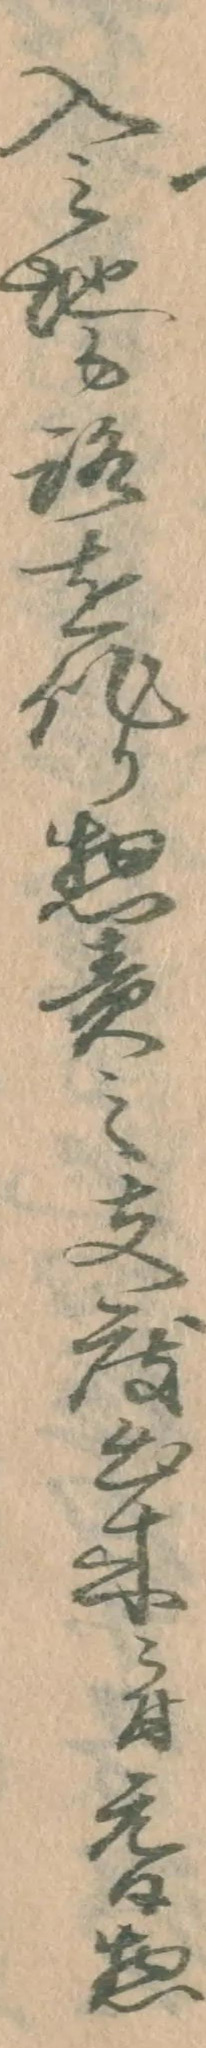入之地も路を作り惣責之支度出来に付元日惣
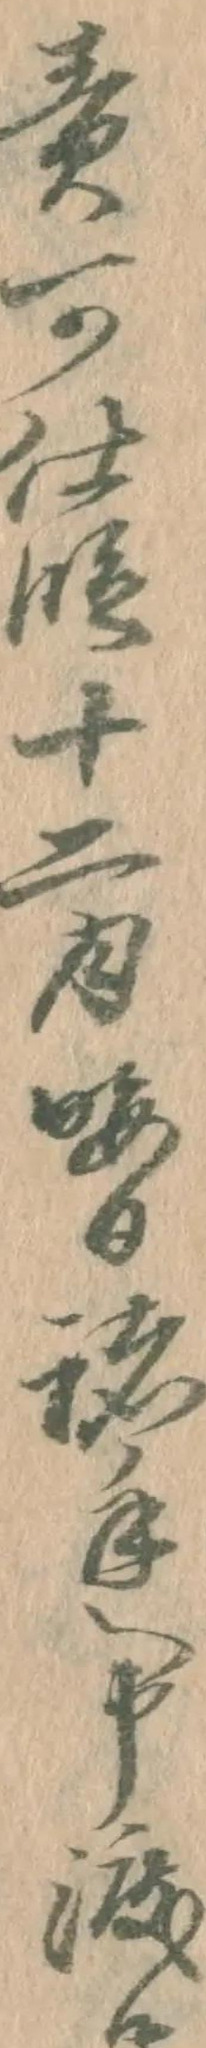責可仕段十二月晦日諸手へ申渡候
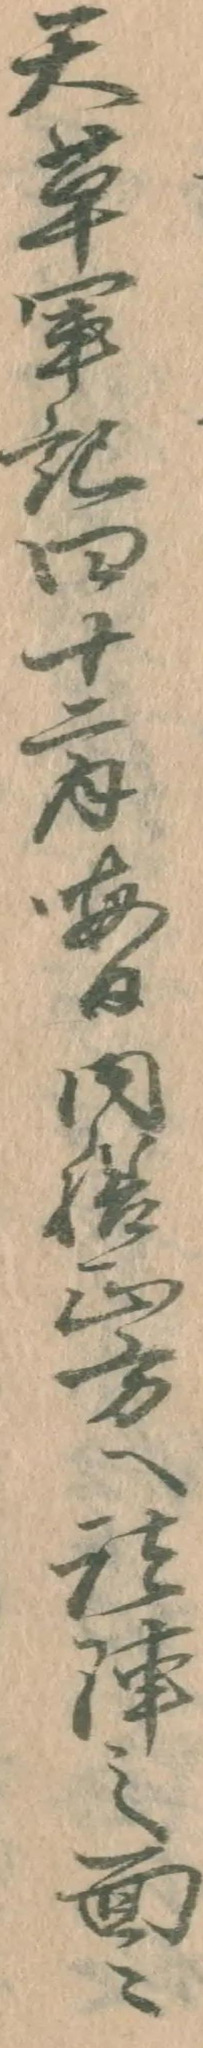天草軍記曰十二月晦日内膳正方へ諸陣之面々
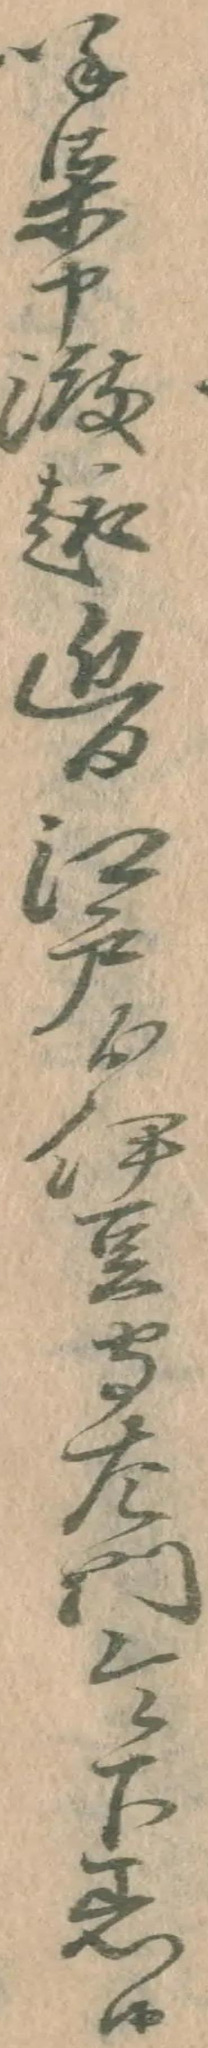呼集申渡趣近日江戸ゟ伊豆守左門令下着候
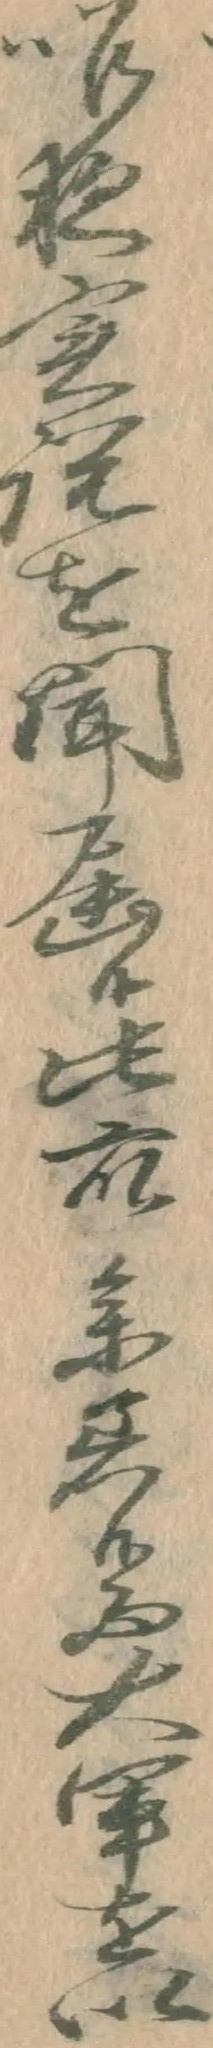昨夜実説を聞届候此衆参着候而大軍を以
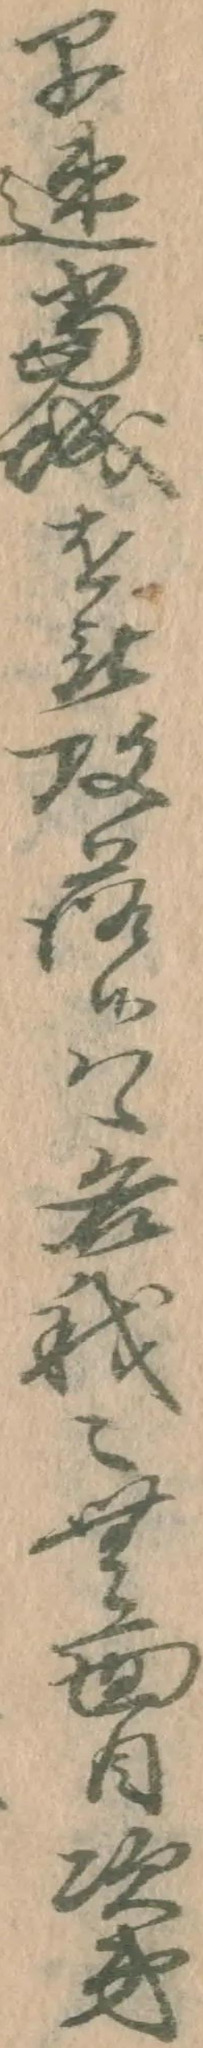早速当城を被攻落候はゝ各我に無面目次第
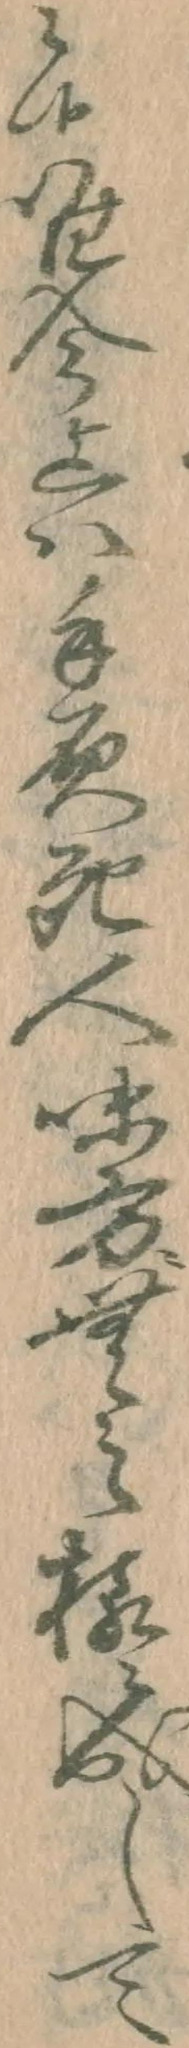に候唯今迄は手負死人味方無之様に成して
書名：切支丹御退治記 49巻. [5]
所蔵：国立国会図書館 National Diet Library, JAPAN
